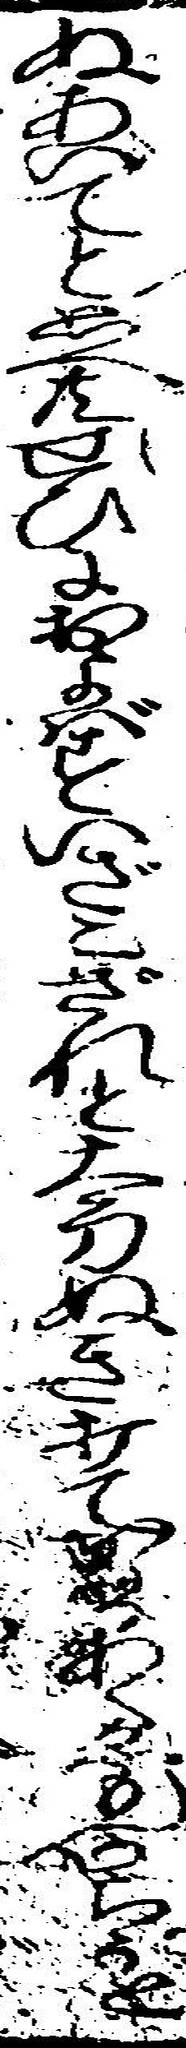ぬあいてと思へ共せひにおよばすいざこざれと太刀ぬき打てかゝるあくゑもんからうと
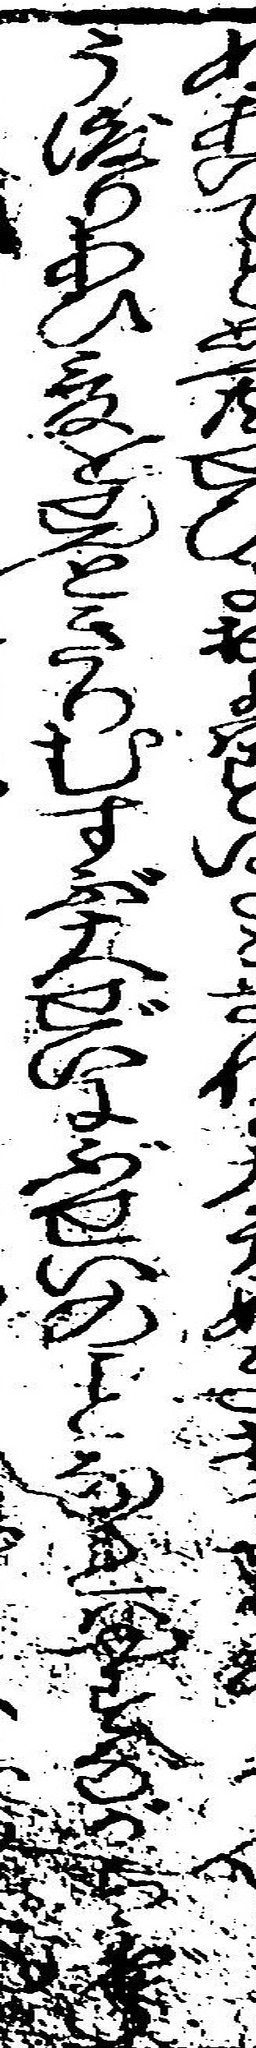う渡りあひ爰をせんときりむすぶ大ぜいにぶせいのことなれはやすながちう
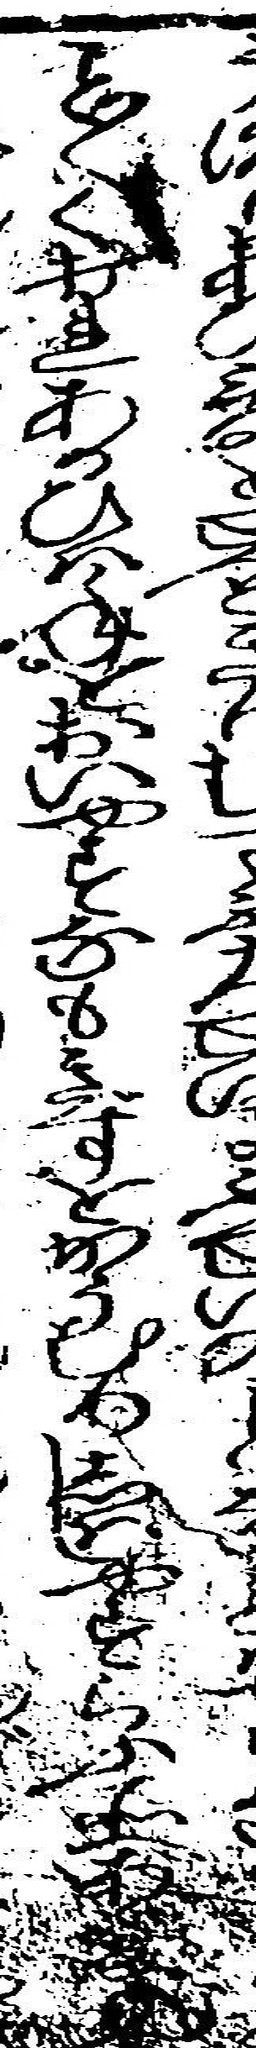こと〳〵く打れあるひは手をおいやすなもきずをかうむりしはしやすらふ所へあくゑもんが
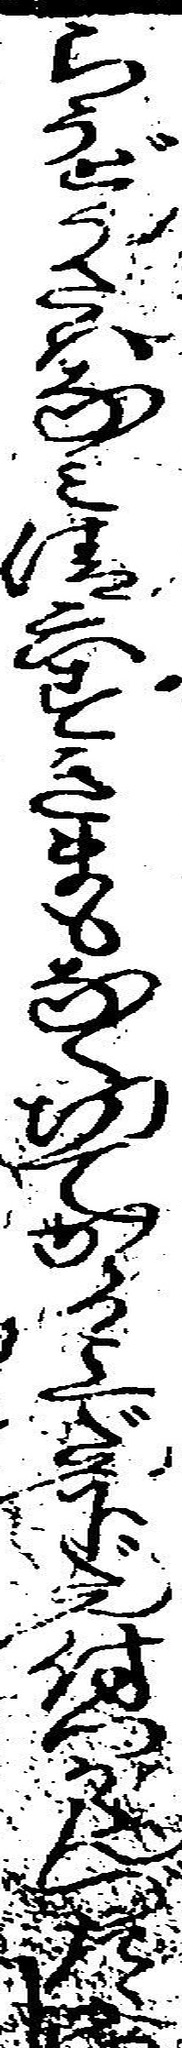らうどうさはなみ清六すきまもなく切てかゝり上だん下だん付つからんづたゝ
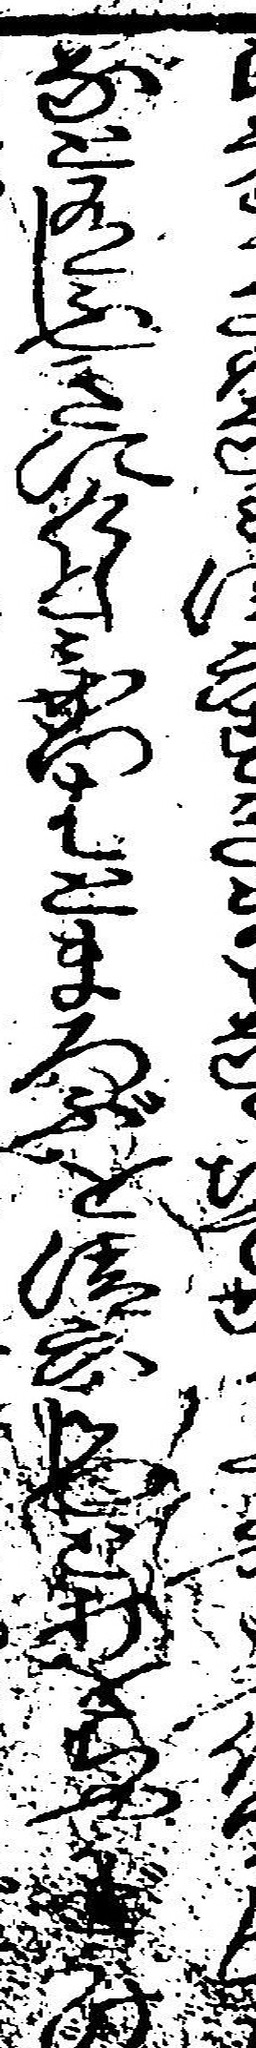なと有ふしきにけしとみかつはとまろぶを清六はつしと打をちやうけとめ…
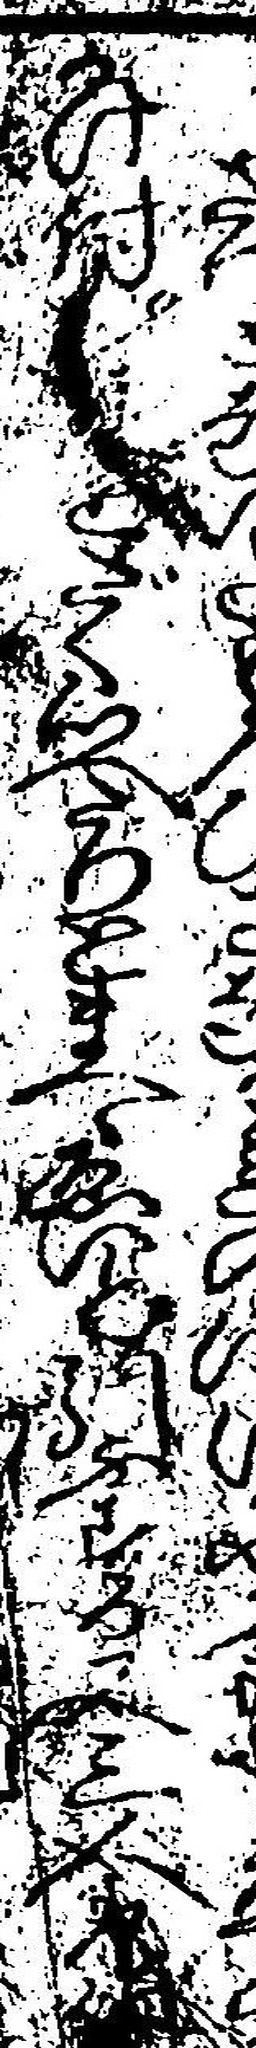かけ付だく心へたりとまへゝゑいと引ふすか又三人是をせと…

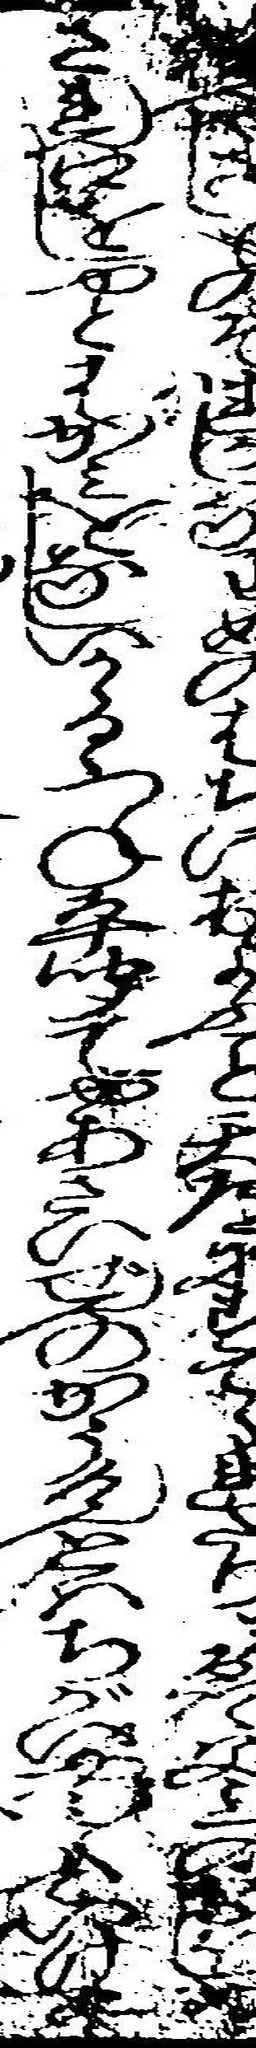されん口をしやとはかみをなしいかるゝつね平聞てやあさいぜんのかうけんとはちがいやみ〳〵是いけ
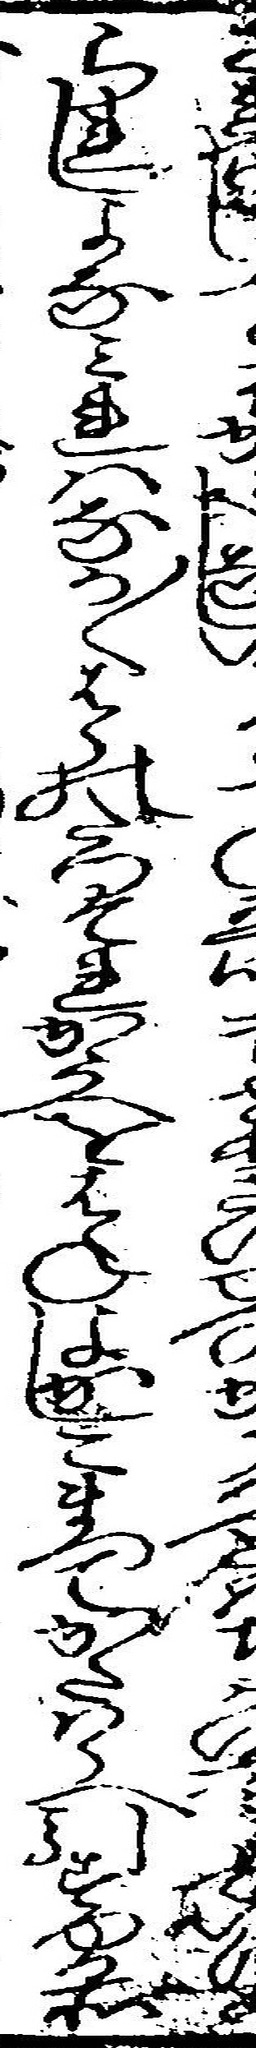られしよなみれはなか〳〵はらのたつそれかうへをはねよかしこまつてかたはらへ引すゆる所
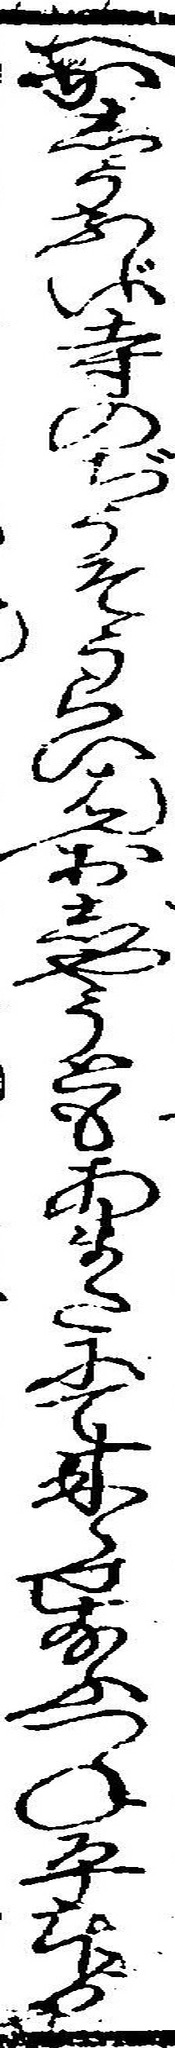へかしうふじい寺のぢうそうらいはんおしやうともあまたにて来らせ給ふつね平本ゟ
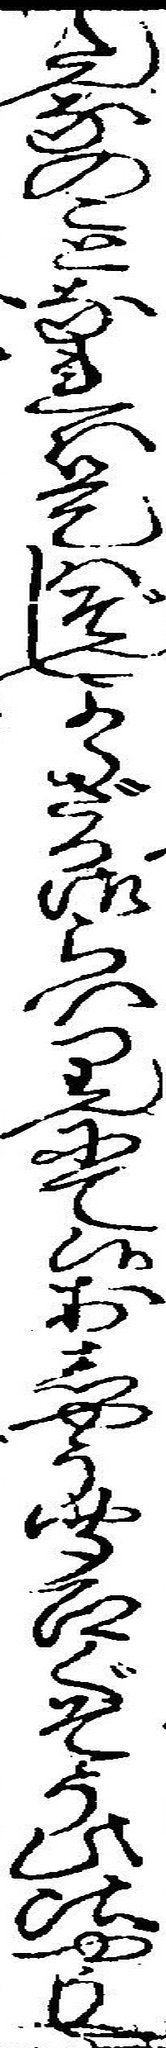たんなのことなれは是はぞんしよらざる御らいりんにて候おしやう聞召ぐそう此頃やうし
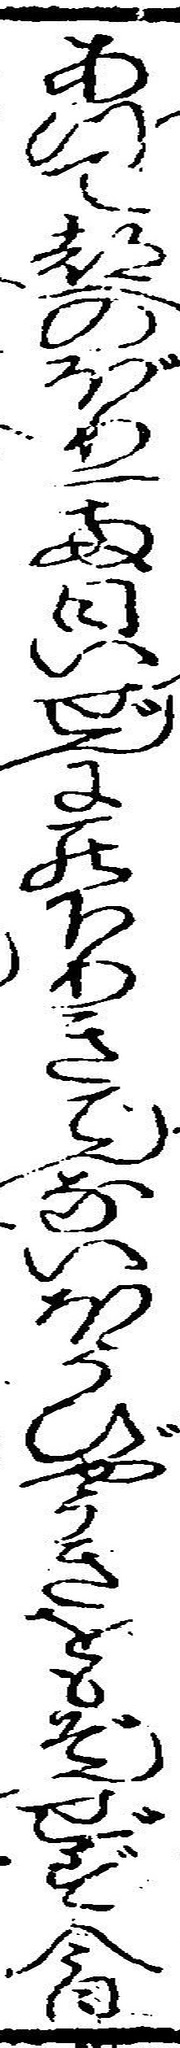あつて都へのぼり一両日いぜんに罷下りきでんないほうびやうきをもぞんぜず今日
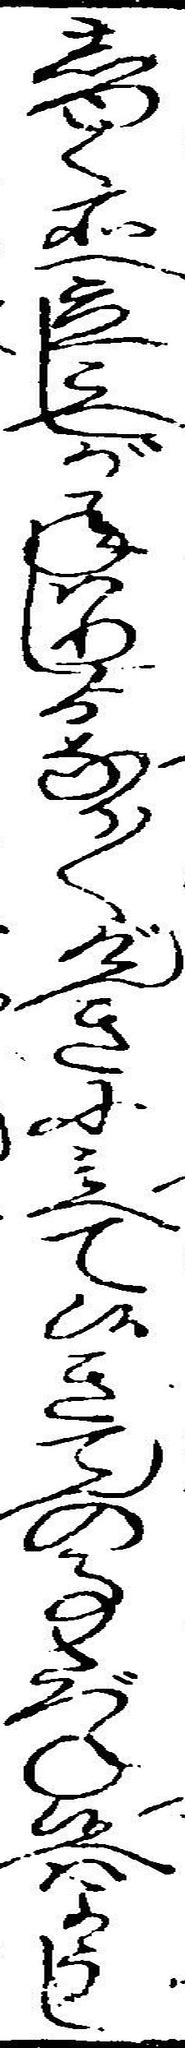しゆく所へ立こへしが承はりしゟなか〳〵げんきにみへて候きてんの事たづね候へはようし
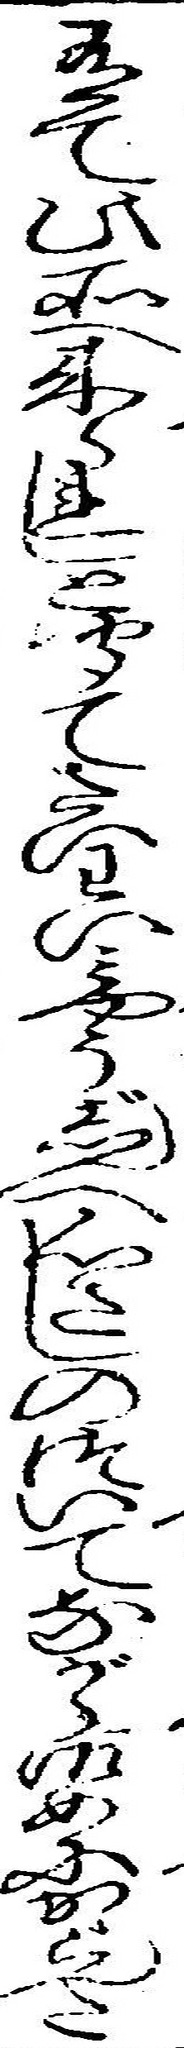有て此所へ来られしと聞てさいはいみやうじんへ心さしのついてながら御めにかゝらんた
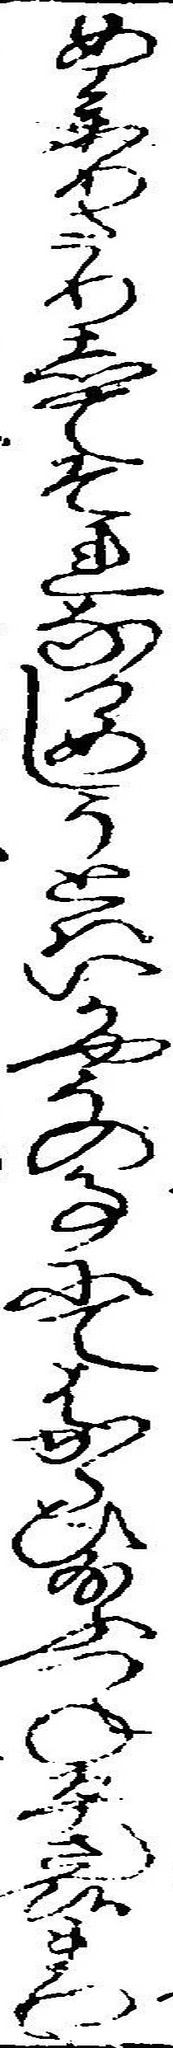め参りたりしてそれなるめしうとはいかやうの事にてはからひ給ふつね平さん候まつ
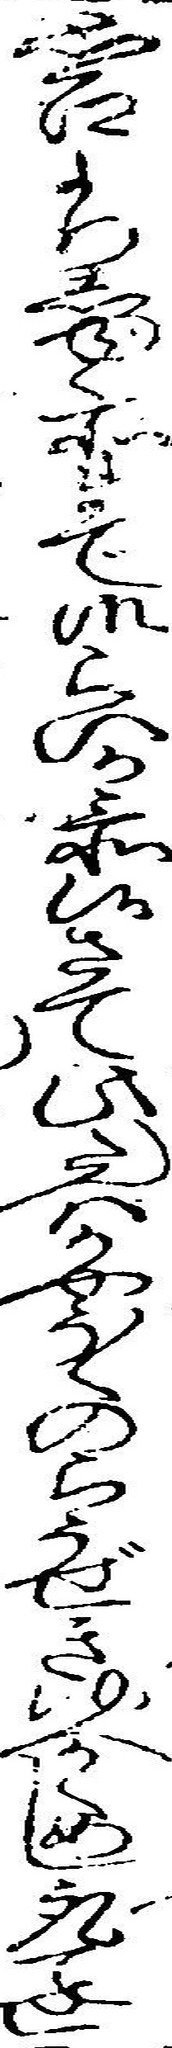思召よりしゆく所まで御らいか忝候さて此たんはかやう〳〵のらうぜきゆへかくめし取てせ
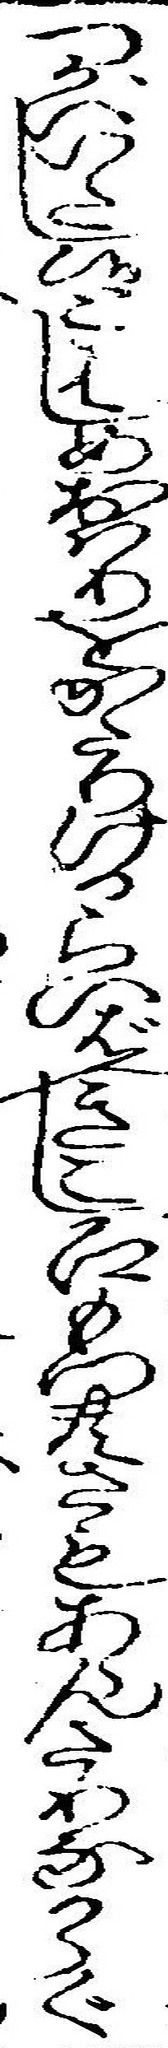つかいいたし候とはしめおはりをかたりけるらいばんきこし召もつ共さもあらんさりなからぐ
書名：[しのだづまつりぎつね付あべの清明出生]
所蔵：東京大学総合図書館 General Library in the University of Tokyo, JAPAN
